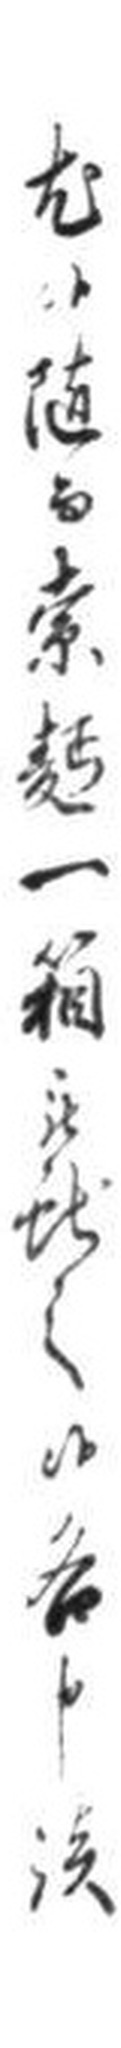尤候随而素麪一箱被献之候各申談
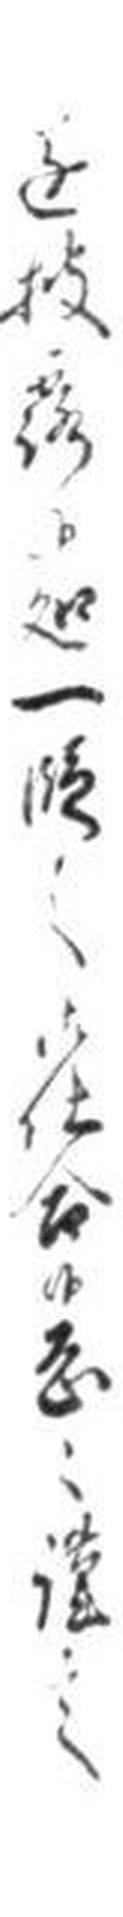遂披露候処一段之御仕合候恐々謹言
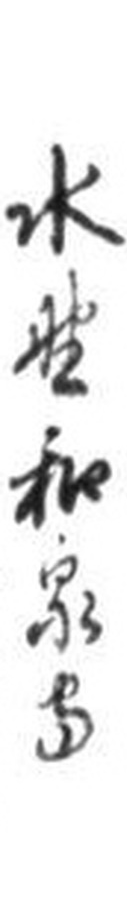水野和泉守
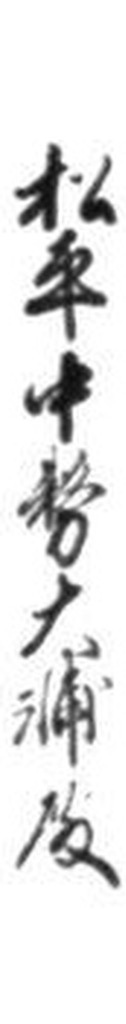松平中務大輔殿
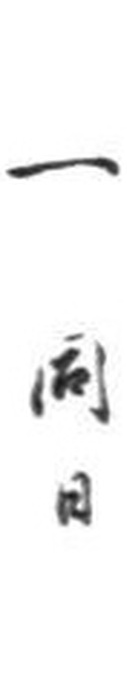一同日
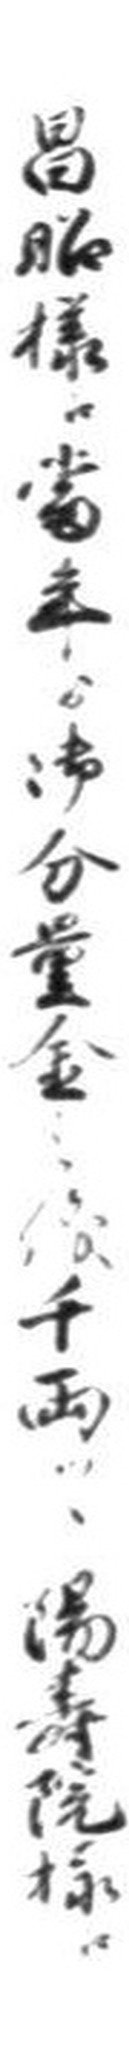昌昭様江当年ゟ御分量金之儀千両ツヽ陽寿院様江
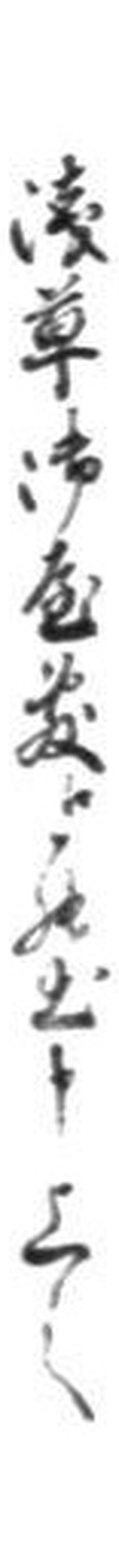浅草御屋敷江罷出申上之
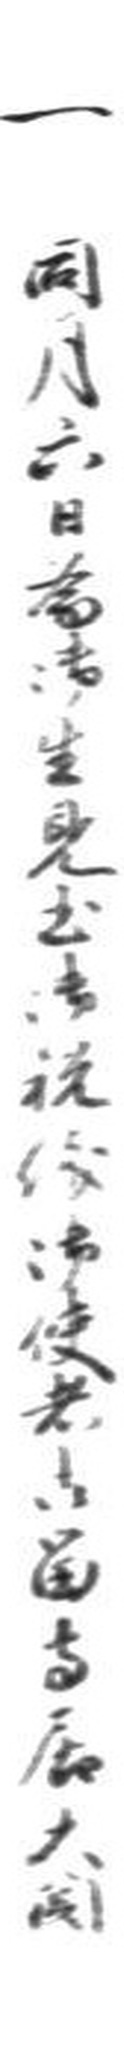一同月六日為御生見玉御祝儀御使者御留守居大関
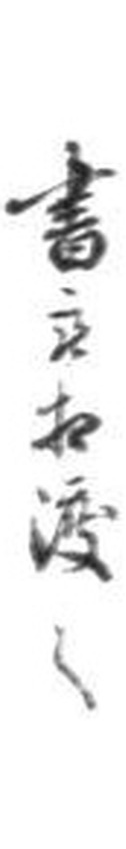書被相渡之

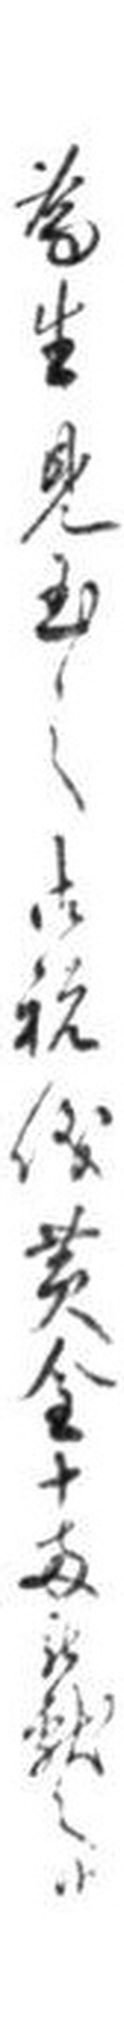為生見玉之御祝儀黄金十両被献之候
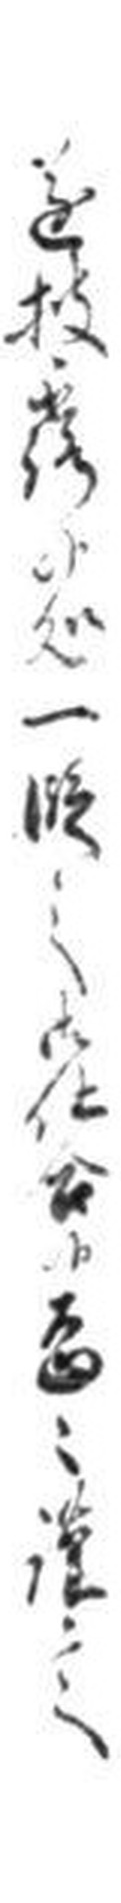遂披露候処一段之御仕合候恐々謹言
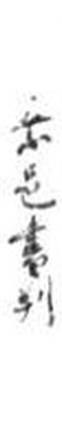乗邑書判
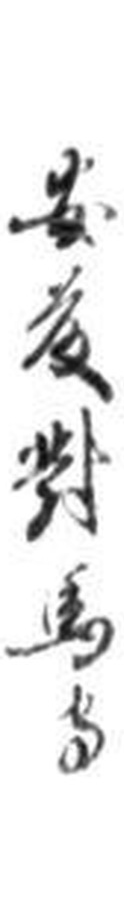安藤対馬守
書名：家譜 三十六 宗昌公 従享保八年到同九年
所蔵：福井県文書館 Fukui Prefectural Archives
